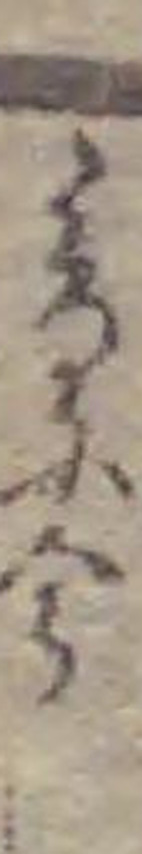みるに今
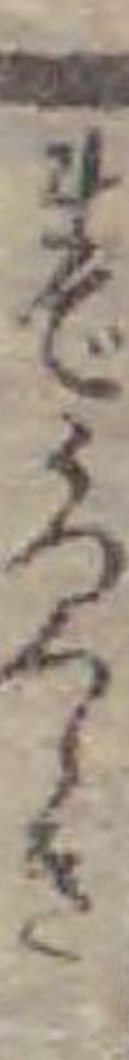まてうつくしき
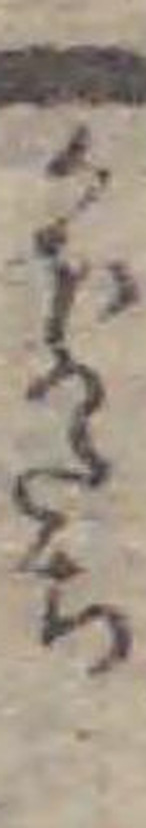かほかたち
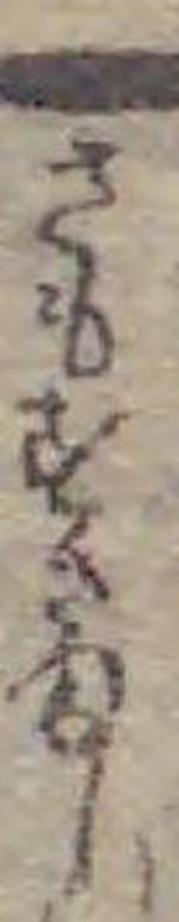さもすさましき
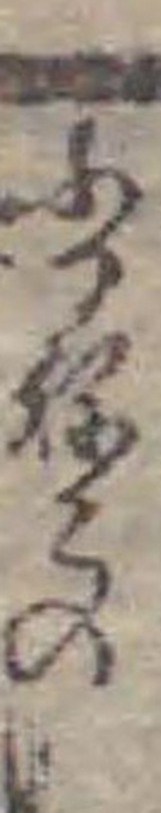ふるねこの
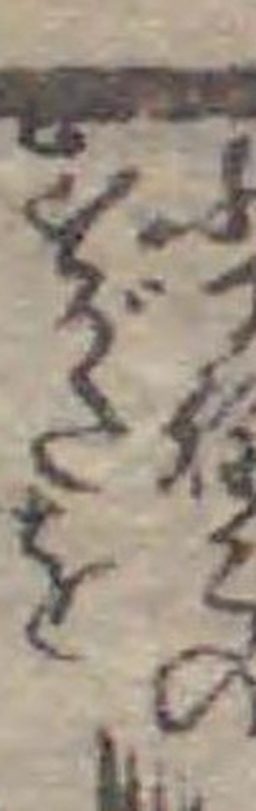すがたを
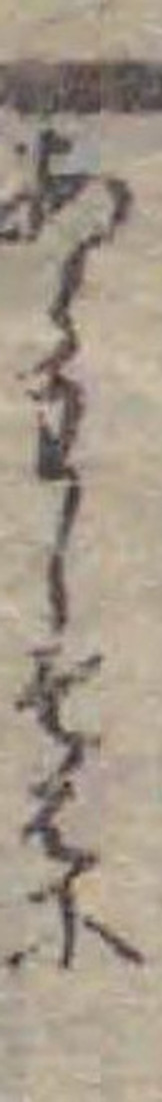あらはしそはに
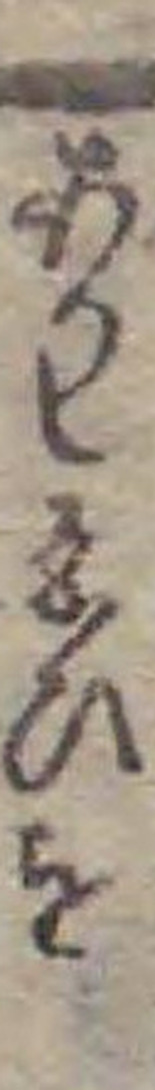ありしゑひを
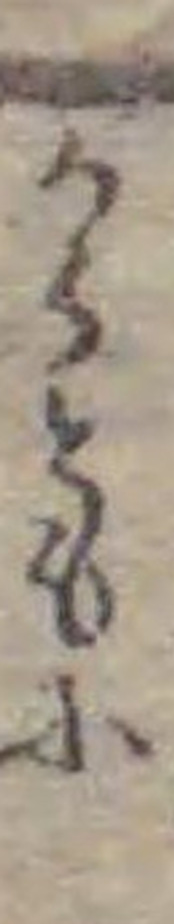からともに
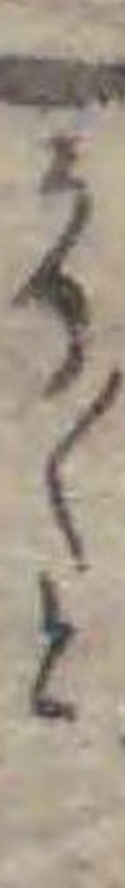かり〳〵と
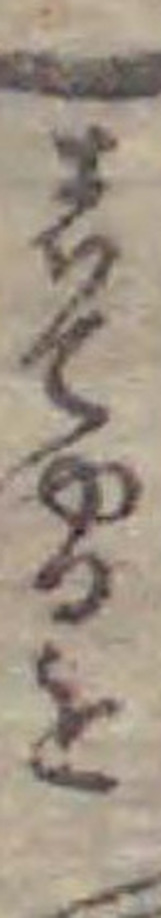してやるを
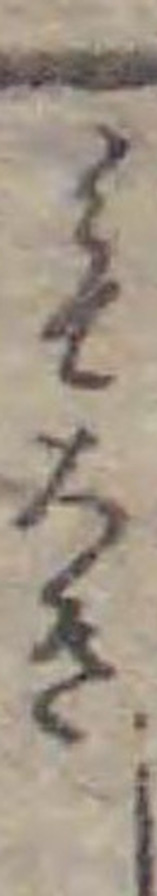みて大き
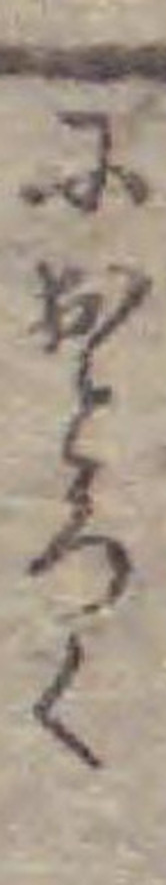におとろく

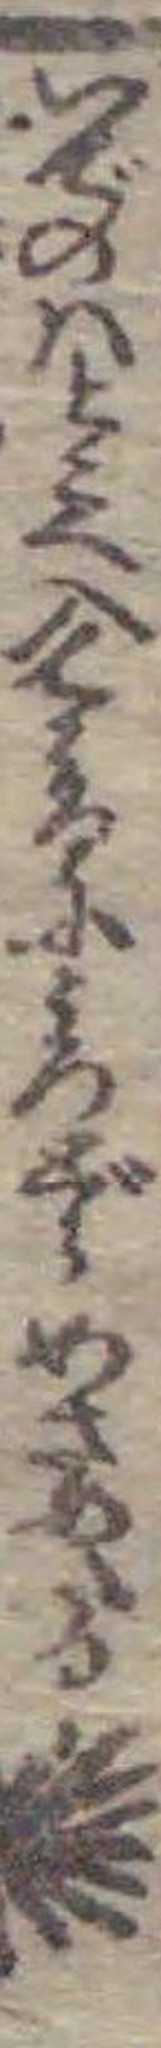いでのはとこへ入てみつにとろどうめさたる
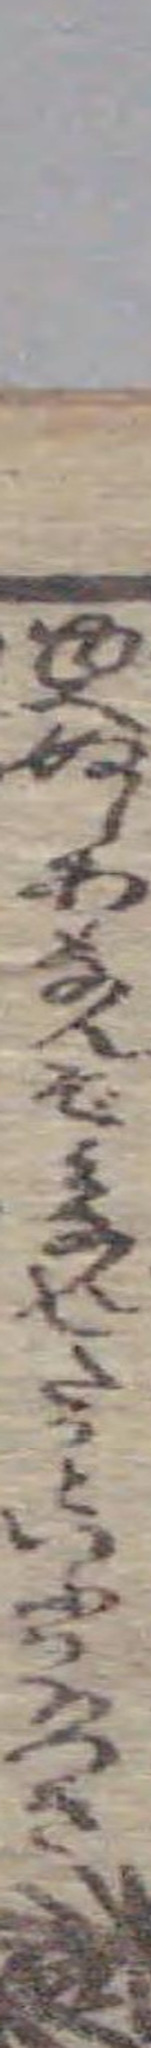ゆへぬしあなんぞみなんしたかといふかほつき
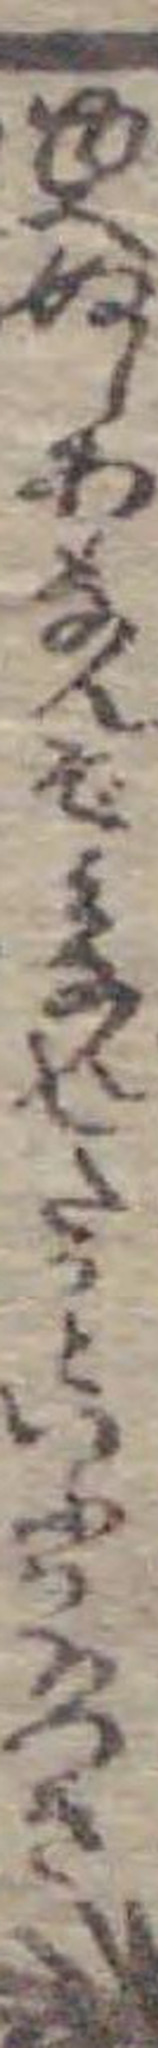ゆへぬしあなんぞみなんしたかといふかほつき
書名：[化物一代記] : 5巻
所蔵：国立国会図書館 National Diet Library, JAPAN
